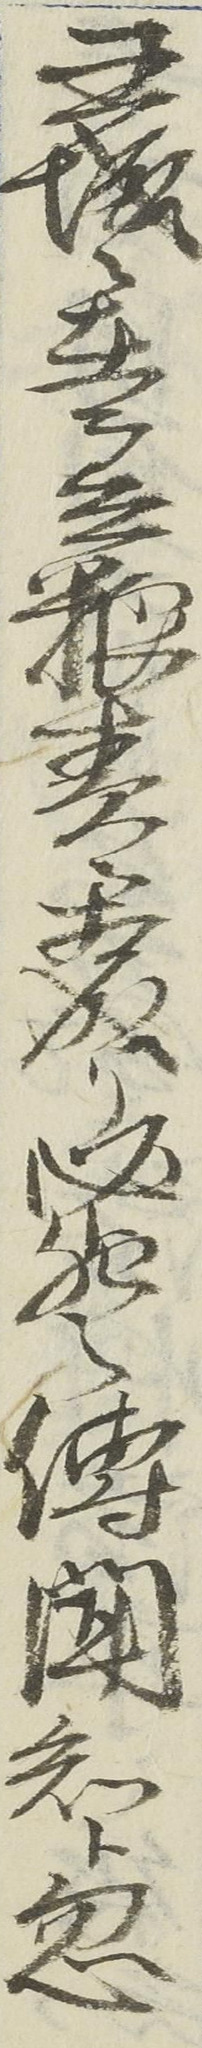王城ニ在テ兵粮責に相成必死之伝聞知ト忽
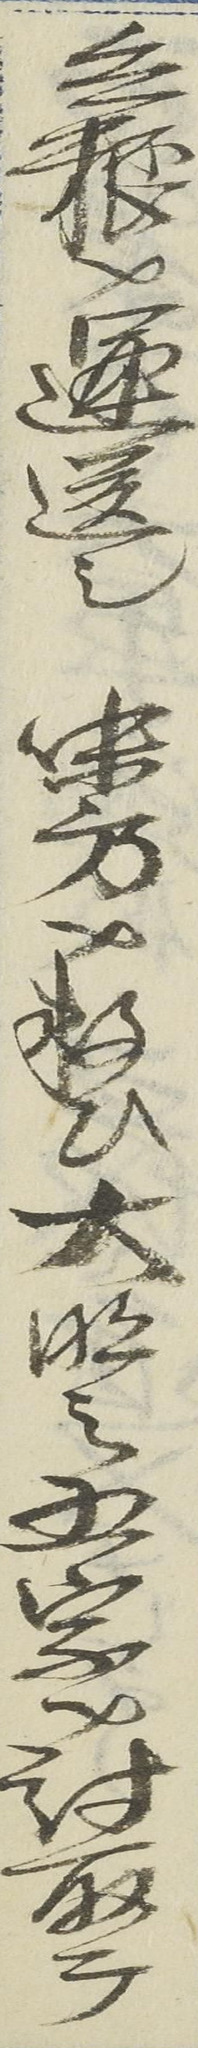兵粮を運送シ味方ヲ救ひ大明之五家ヲ討取テ

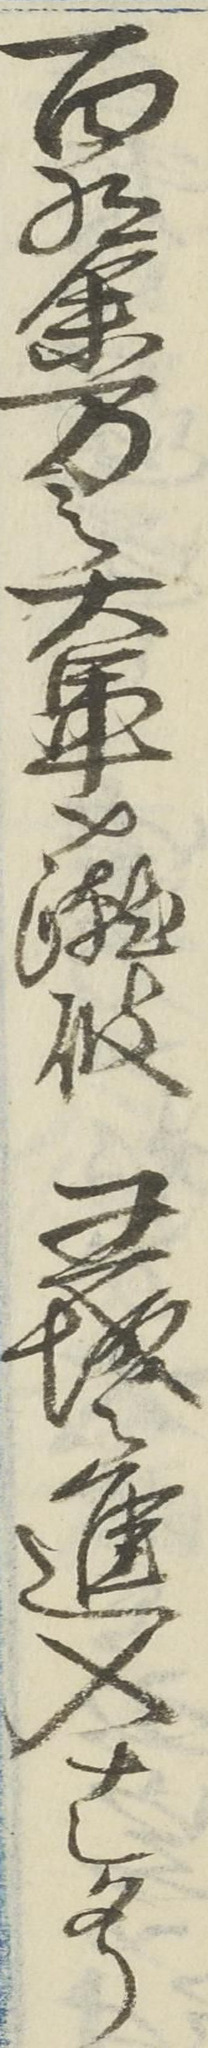百拾余万之大軍を蹴破王城ニ進入ナシタリ
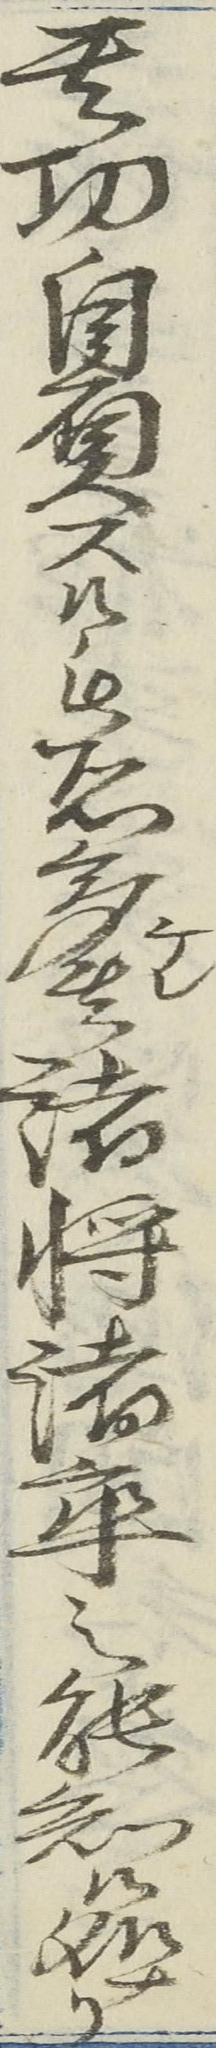其功自負スルノモ恐多ケレ共諸将諸卒之能知ル処ナリ
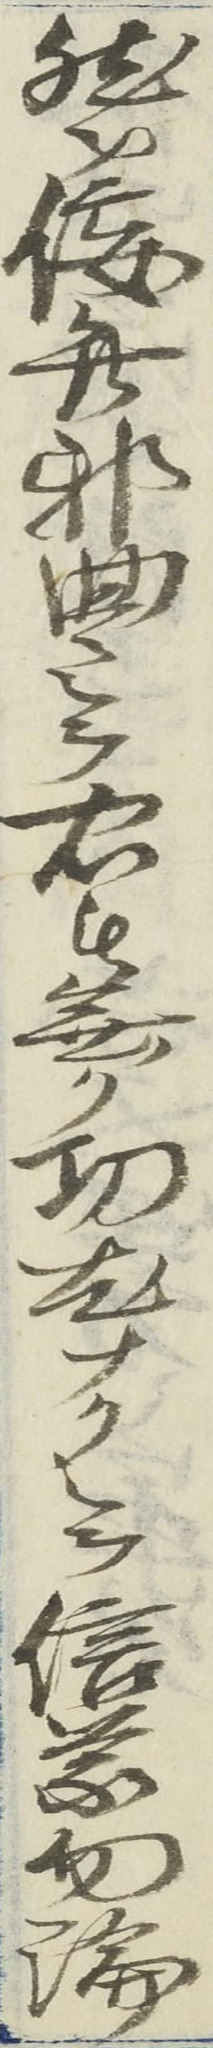然ヲ佞弁邪曲ニシテ忠も無ク功尤ナクシテ信義勿論
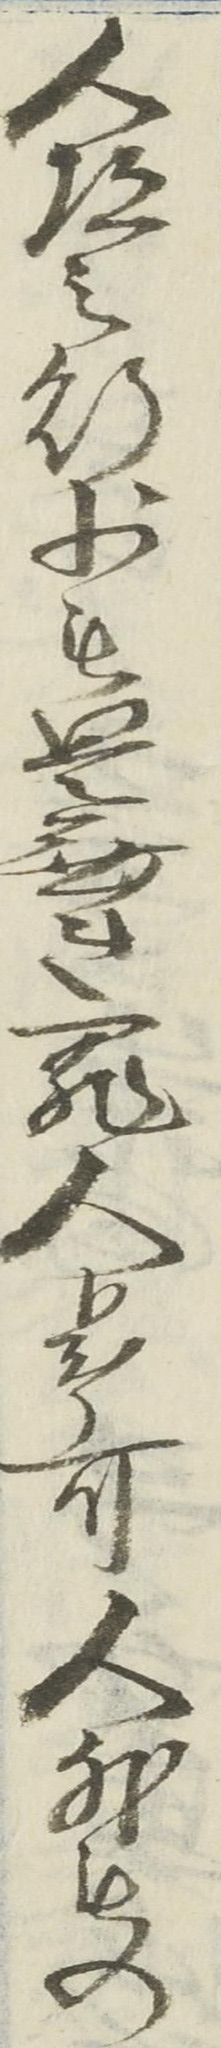人道之行少も是無き罪人ト云う可人外もの
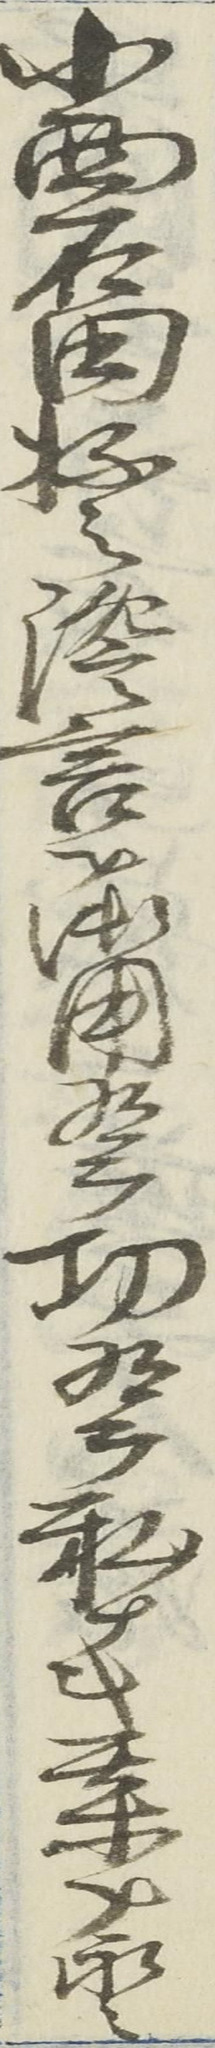小西石田抔之讒言を御用有テ功有テ私ナキ某ヲ永々
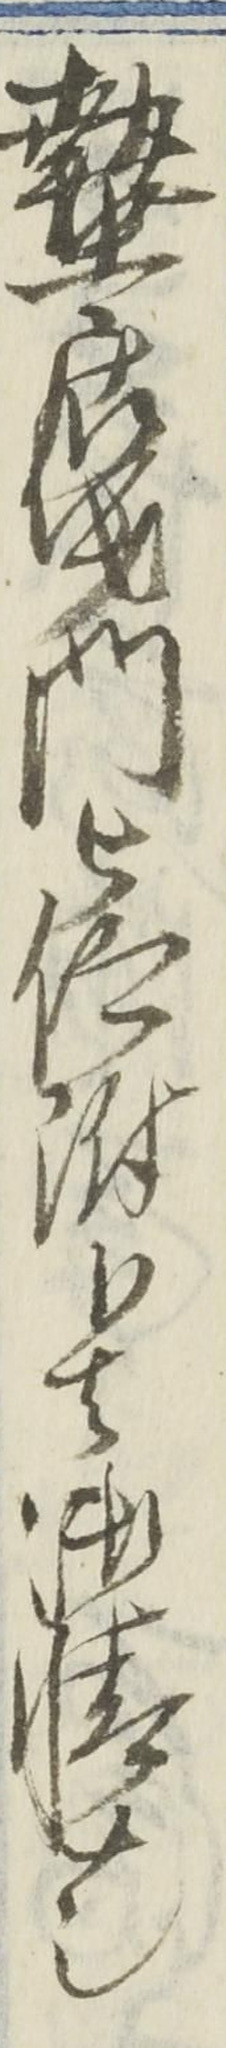蟄居閉門被仰付トは御情ナシ
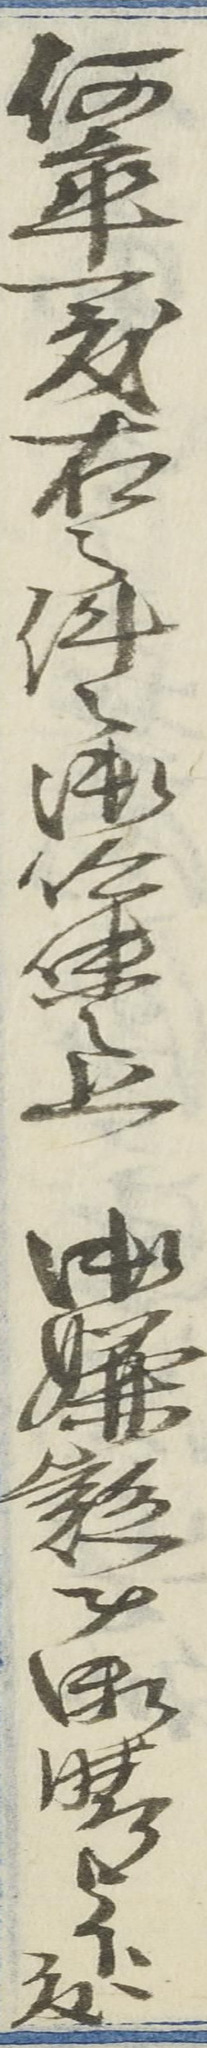何卒一度右之件之御吟味之上御嫌疑ヲ御晴被下度
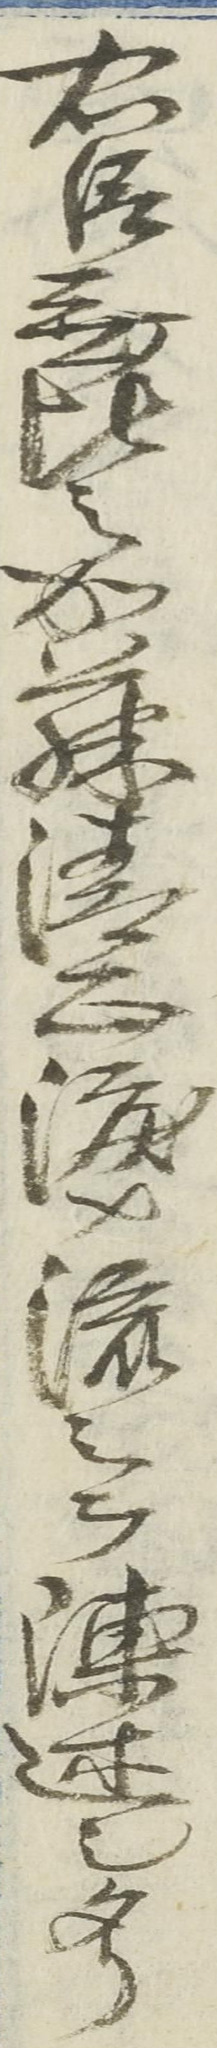忠臣無比之加藤清正涙ヲ流シテ陳述シタリ
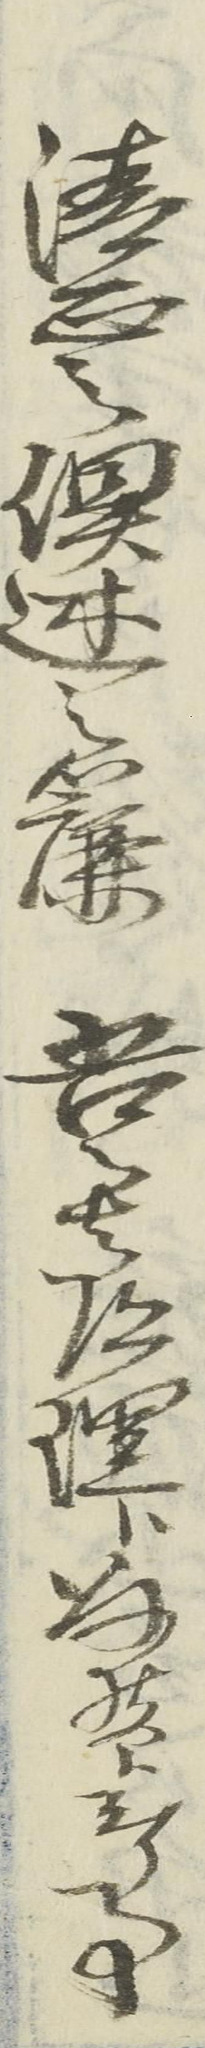三清正之倛述之簾吾々は道埋ト存候ト云う事
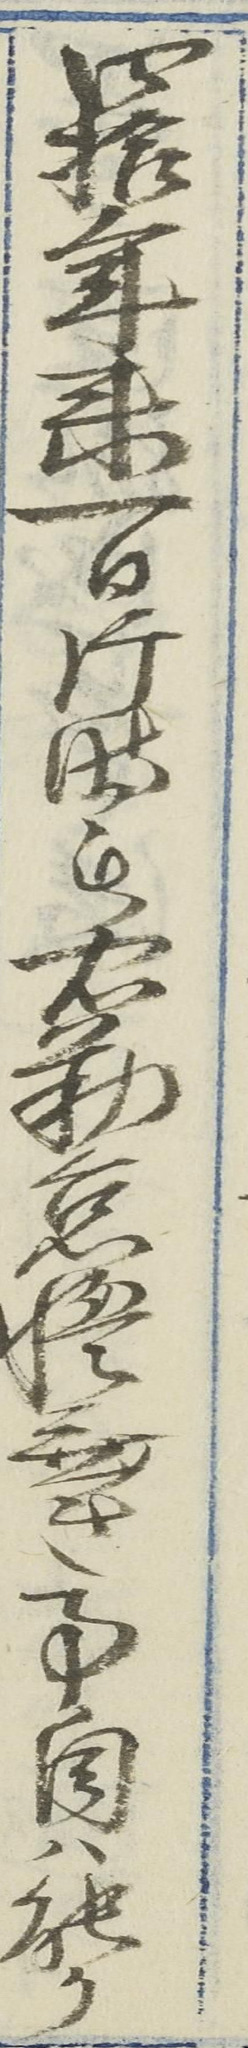四拾年来一日片時も忠勤怠慢無き事自ハ能ク
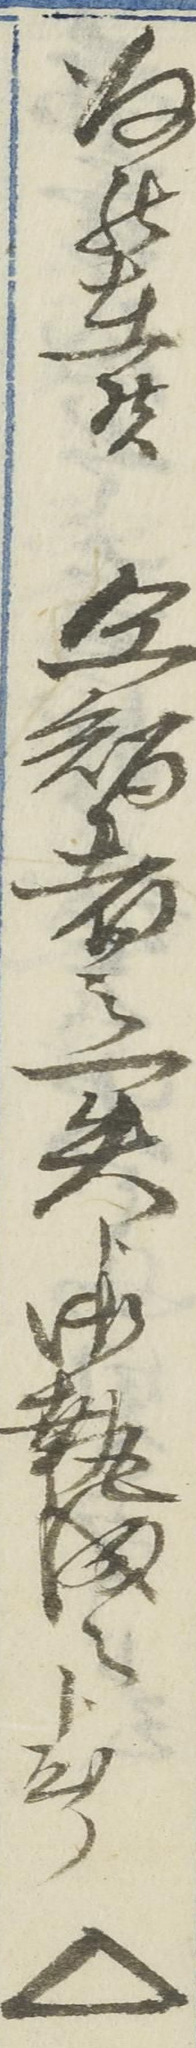存罷在候同智者之一失ト御執成ニト云う△
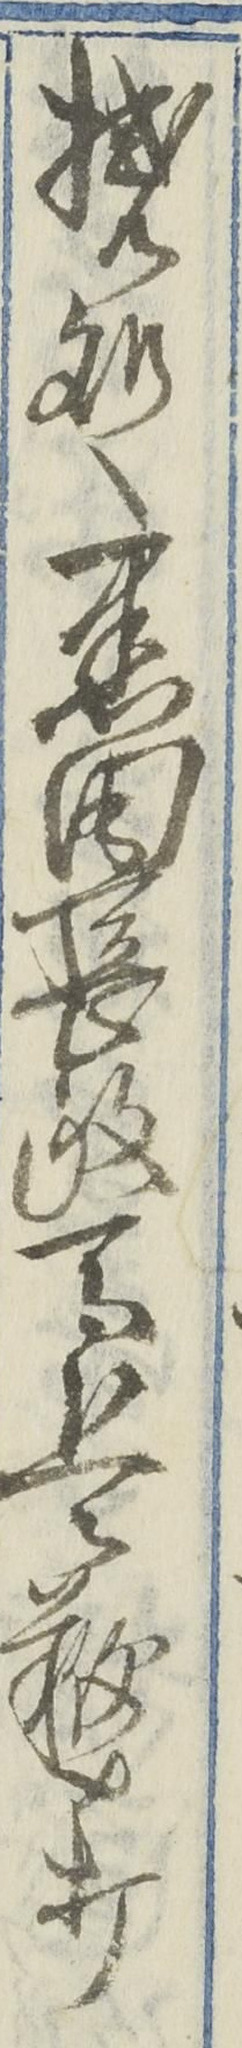掛ル処へ黒田長政馬上ニ鞭を打
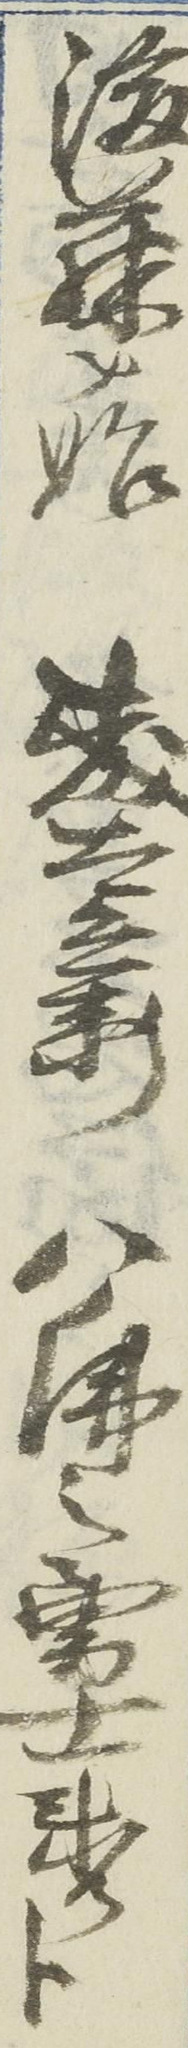後藤ヲ始森太兵衛八州之勇士来ルト
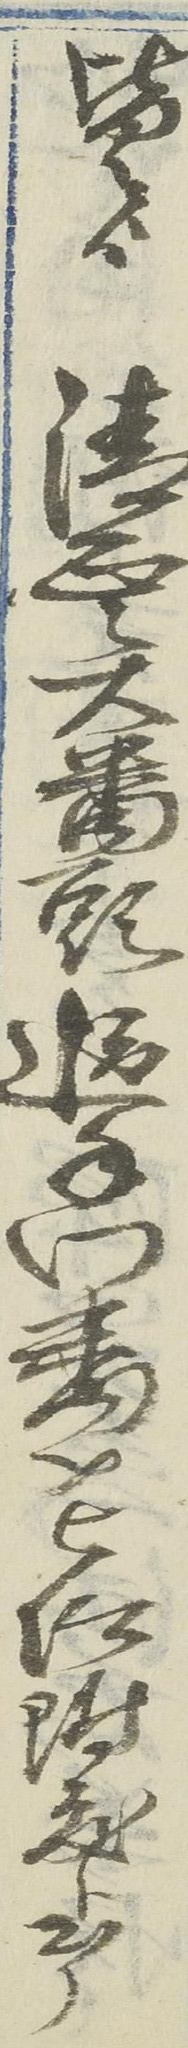皆々ゟ清正ニ大番頭追手門番を被仰付度ト云う
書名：伏水大地震
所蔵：東京大学地震研究所図書室 Earthquake Research Institute Library, The University of Tokyo, JAPAN
